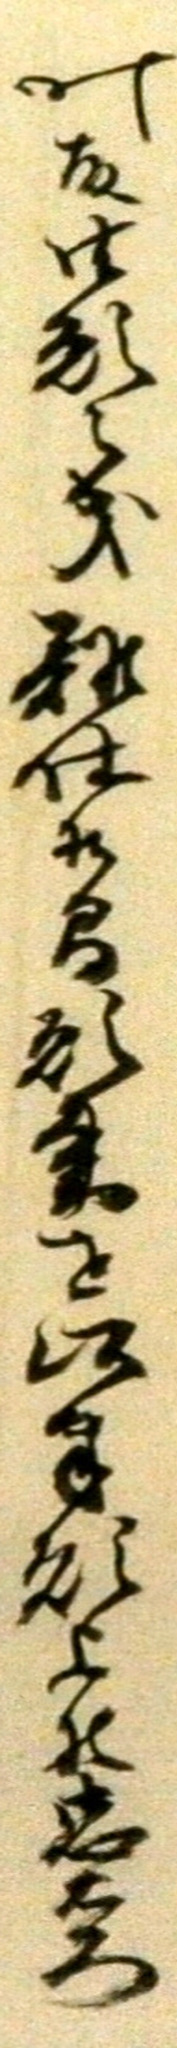叶故御願之義難仕候間願書を以奉願上候忠右衛門
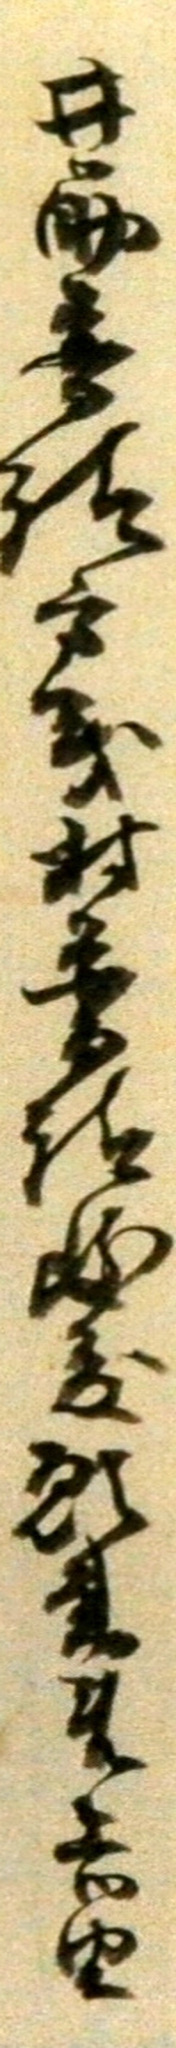井筋普請方義村普請此度願書差上候由
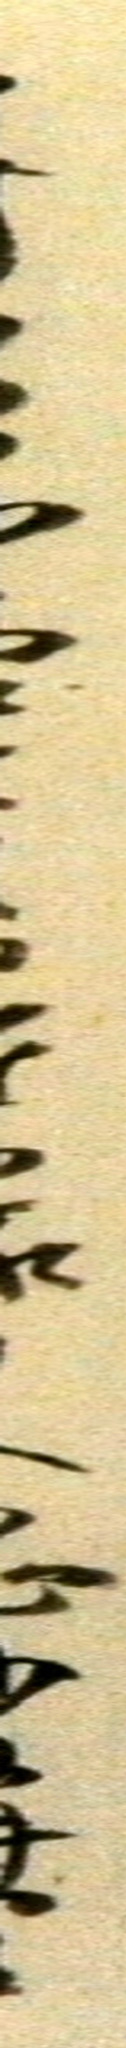申聞候間下乗二ても見せ候様申入候処下々も

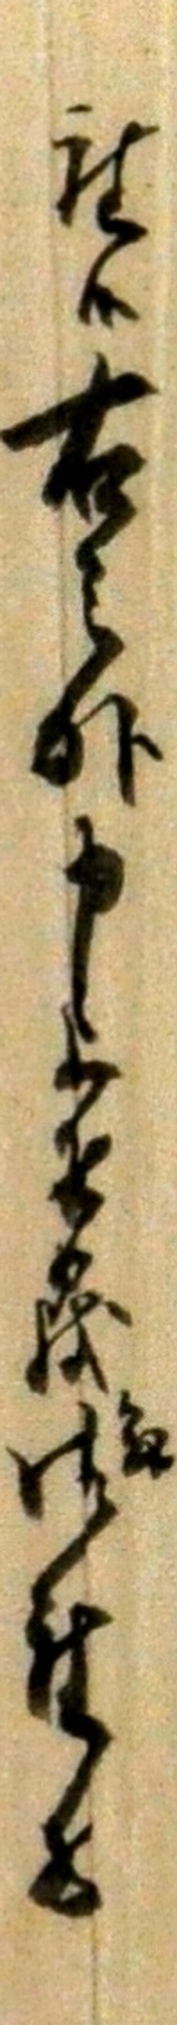座候右之外申上奉候義無御座候
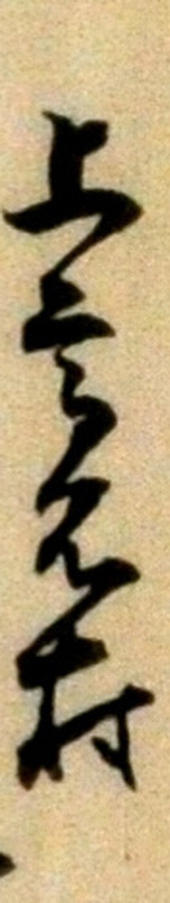上高見村
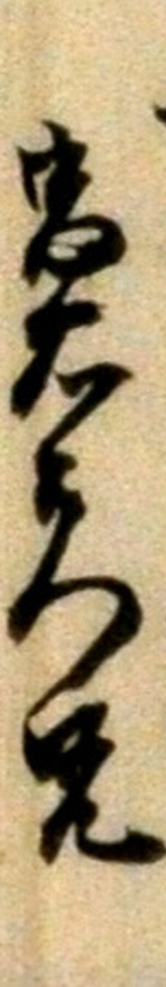忠右衛門兄
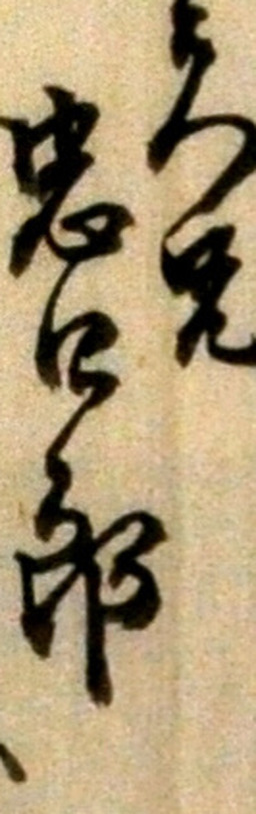忠四郎
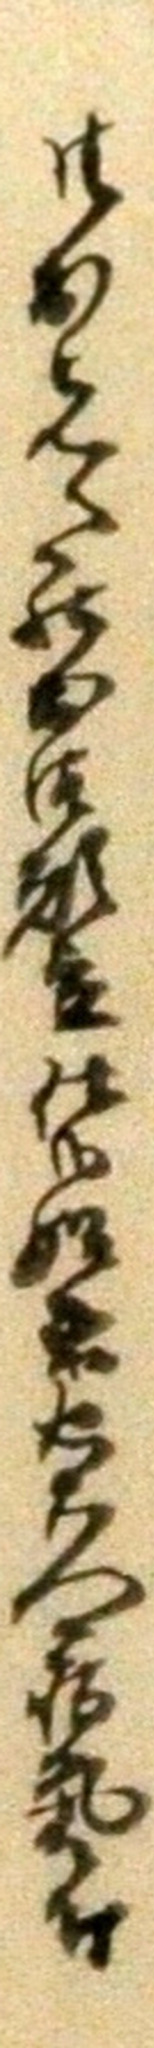御出先々罷出御願置仕候娘忠右衛門病気ニ付
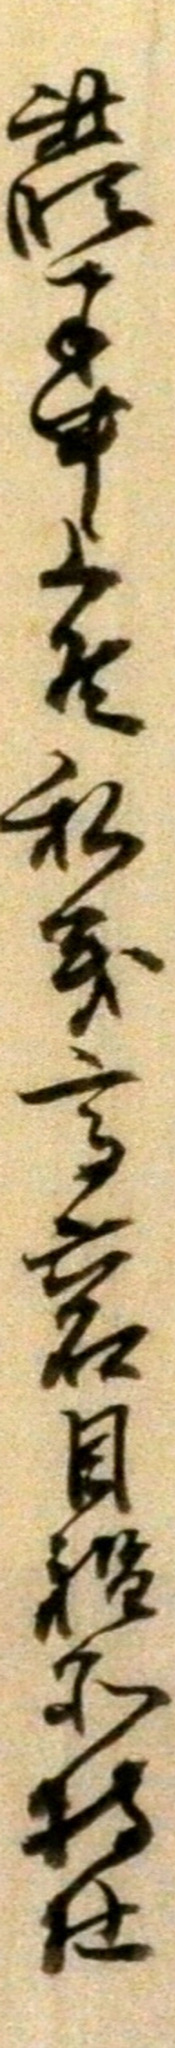此段奉申上候私義高六石目禮所持仕
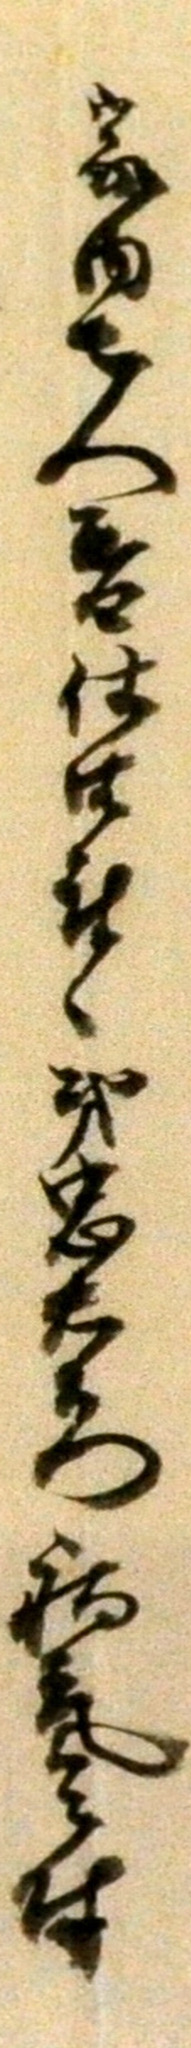家内七人暮仕御座候弟忠右衛門病気ニ付
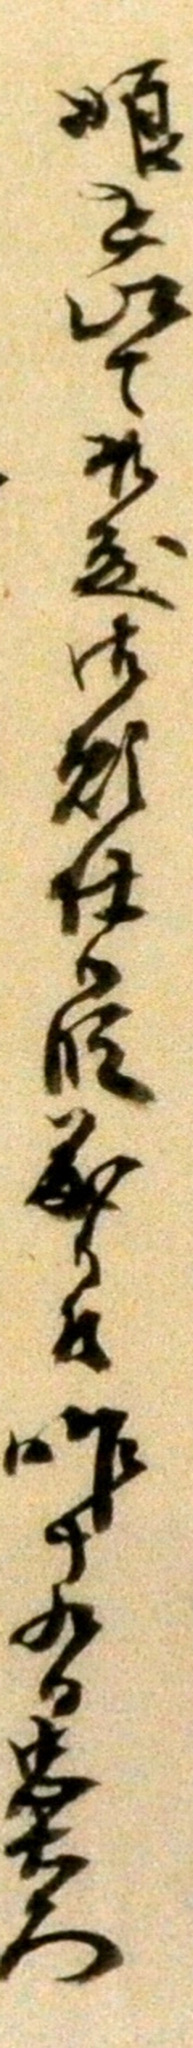娘を以て此度御願仕候段承り付昨十九日忠右衛門
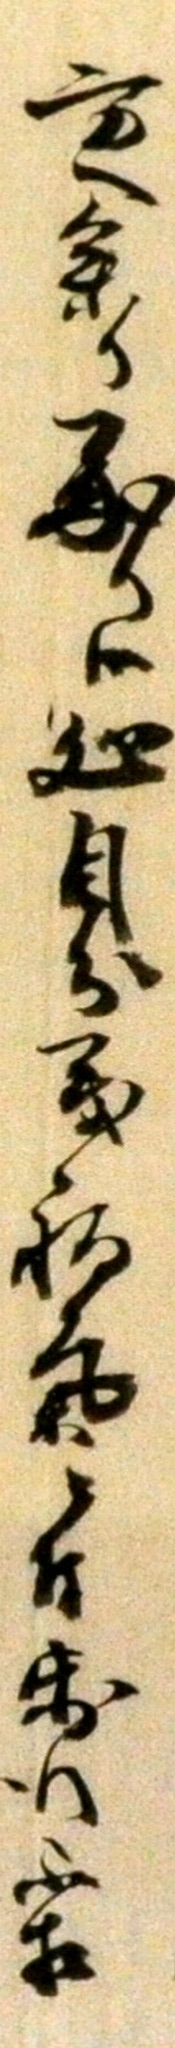方へ参り承り候処自分義病気ニ付歩行不相
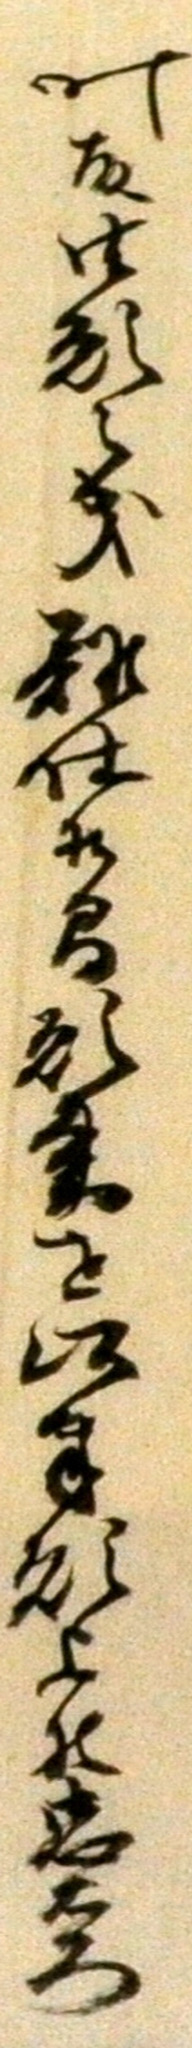叶故御願之義難仕候間願書を以奉願上候忠右衛門
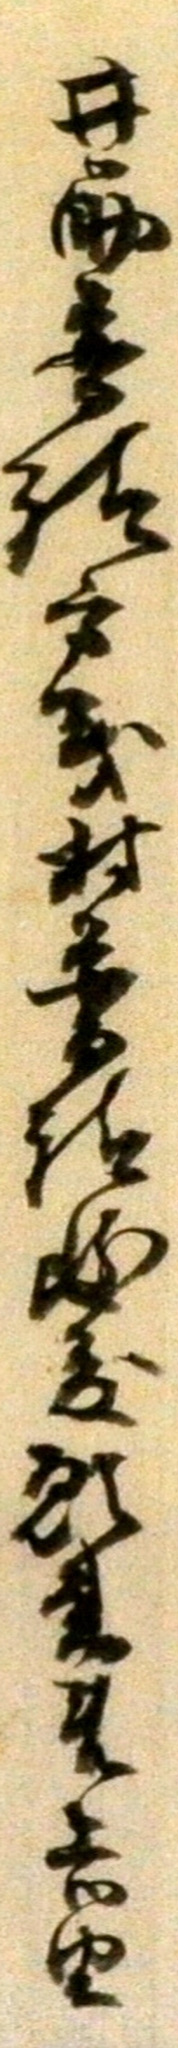井筋普請方義村普請致度願書差上候由
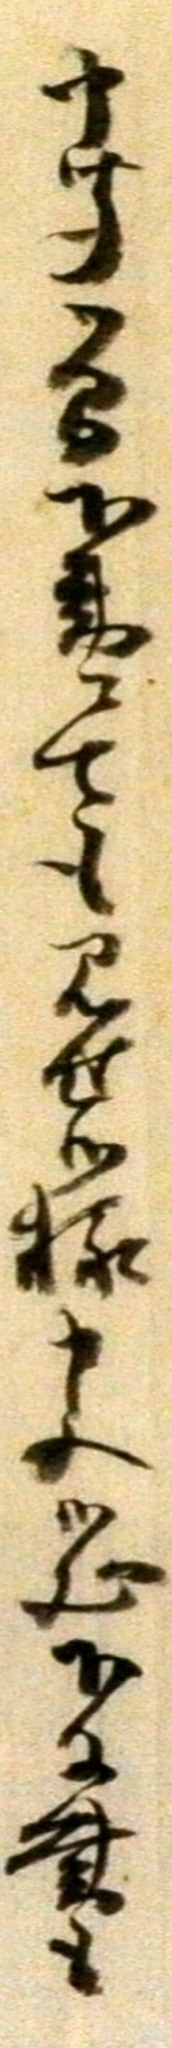申聞候間下乗二ても見せ候様申入候処下タ書も
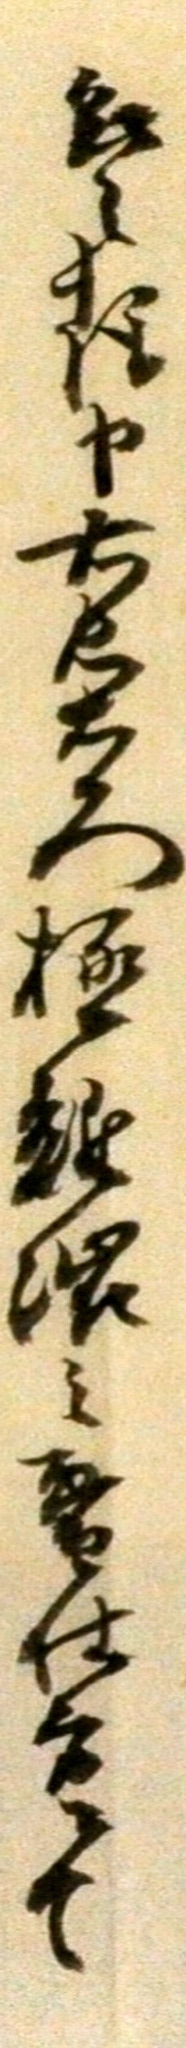無之趣申右忠右衛門極難渋之暮仕方二て
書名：中沢村駕籠訴事件書類写
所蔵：伊那市立高遠町図書館・合同会社AMANE
